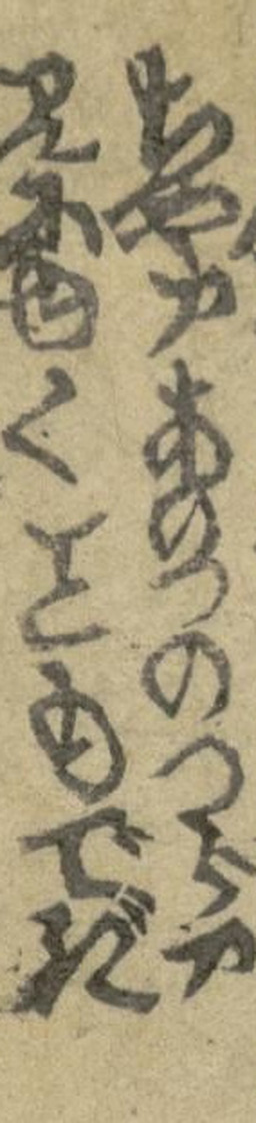みにゆくこともでき
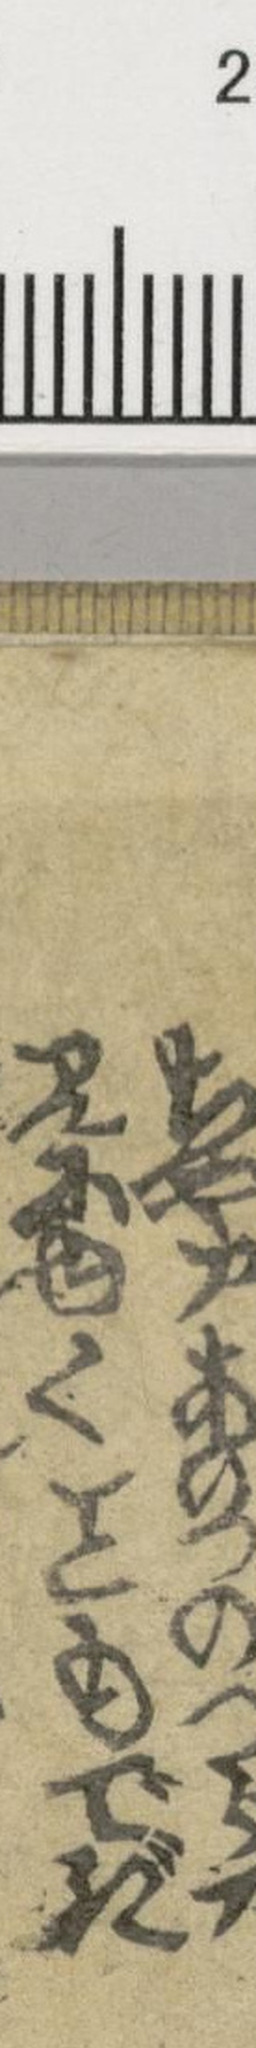みにゆくこともでき
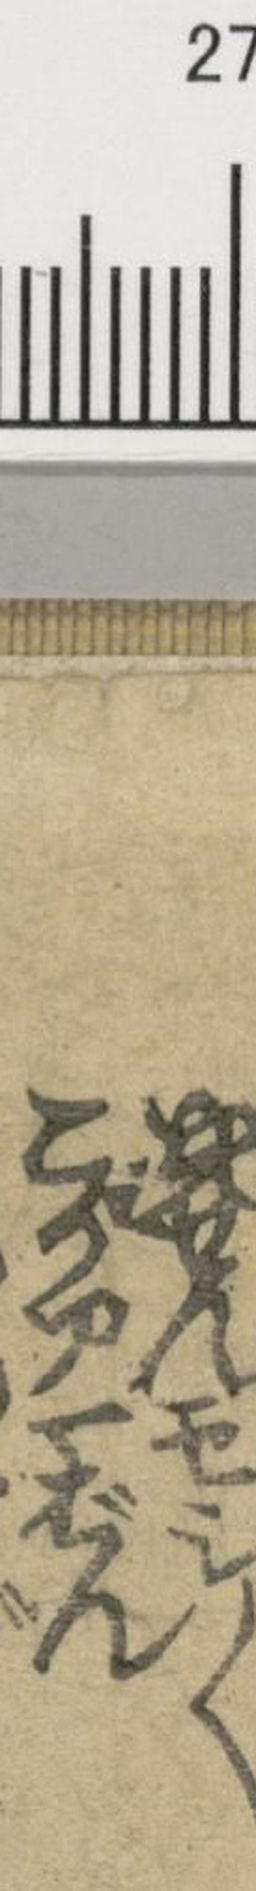こりア一ばん
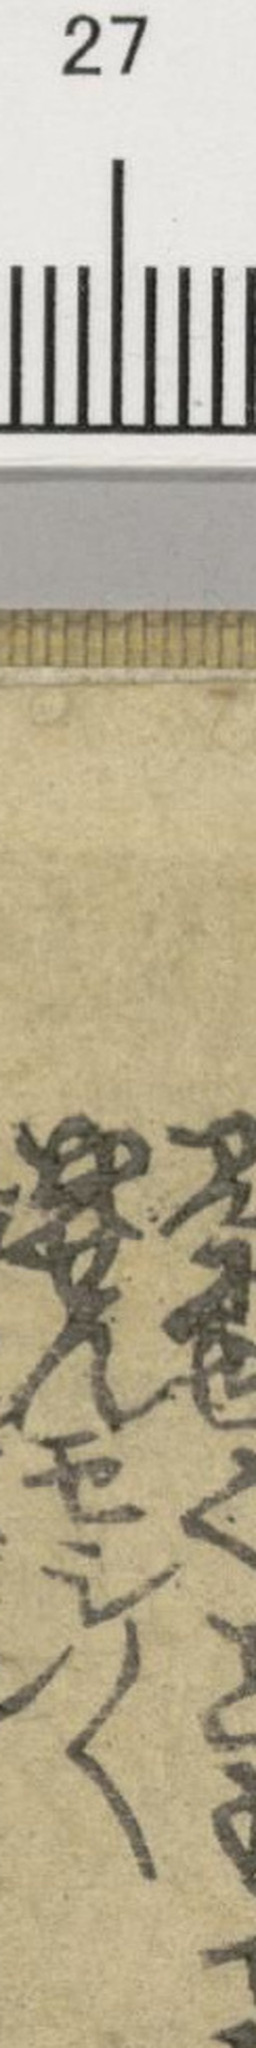やせんモシ〳〵
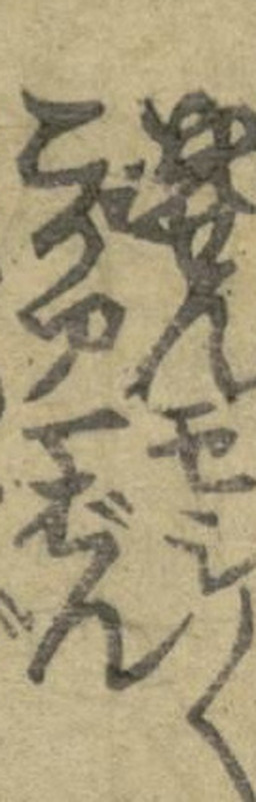こりア一ばん
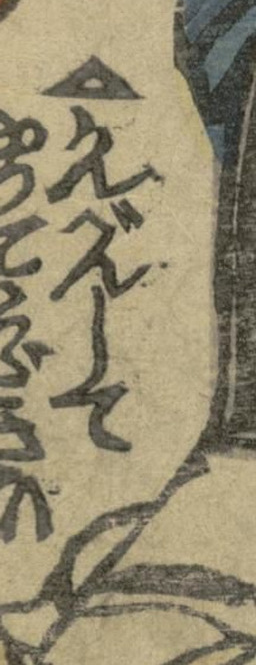△かんべんして
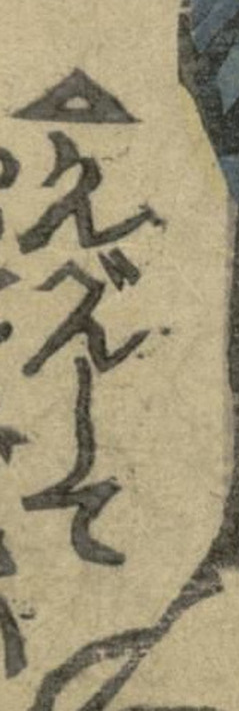△かんべんして
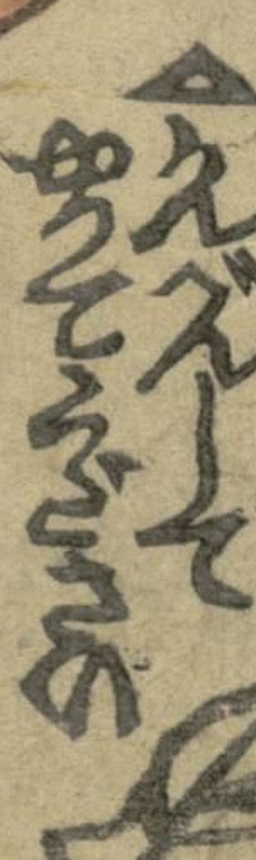やつてください
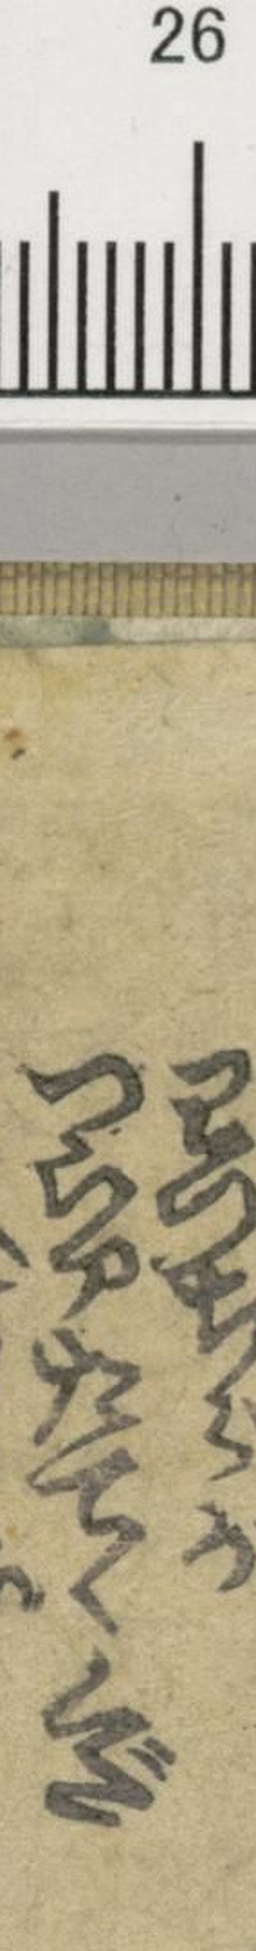つらアたてゝくだ
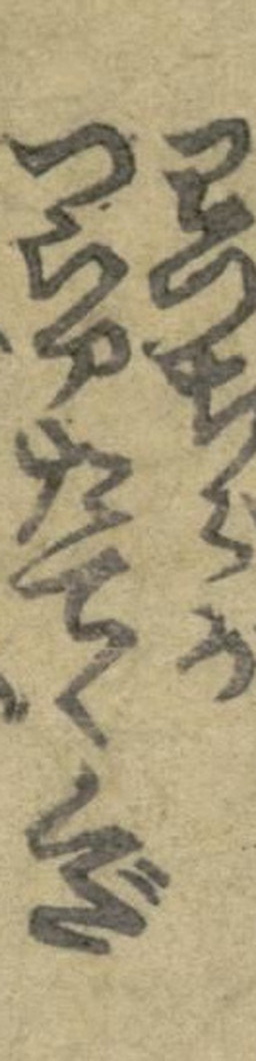つらアたてゝくだ
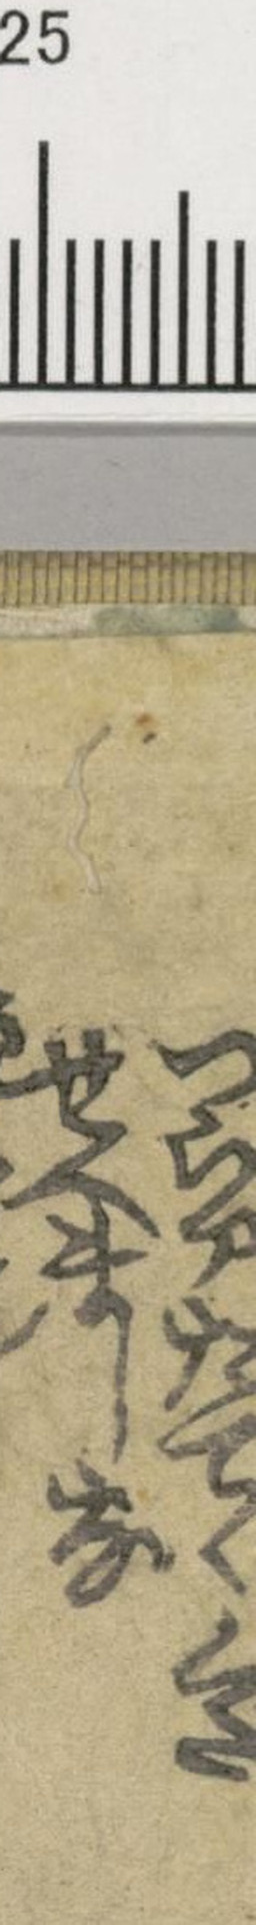せへましな
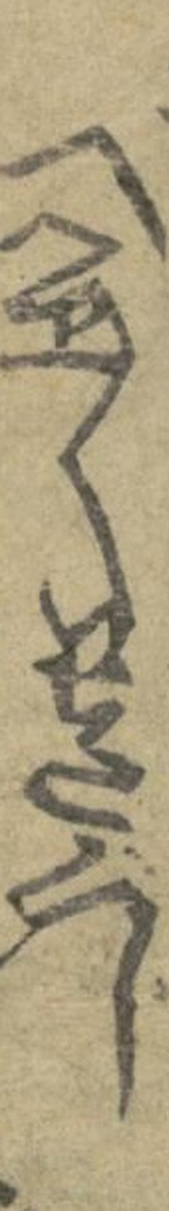〽ヘエ〳〵わたくし
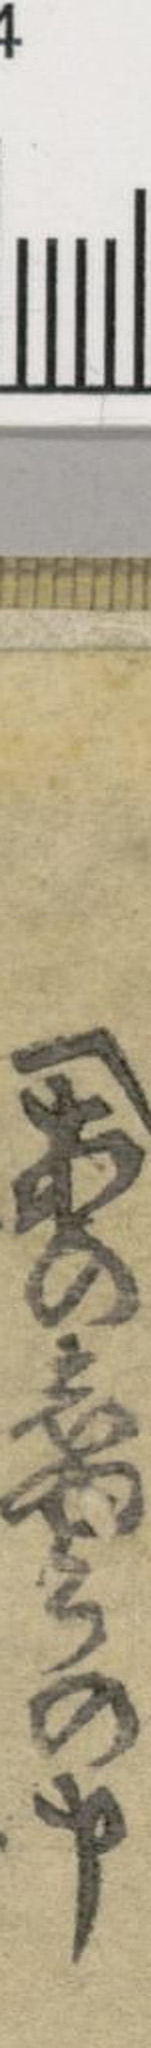〽おのしやらの申
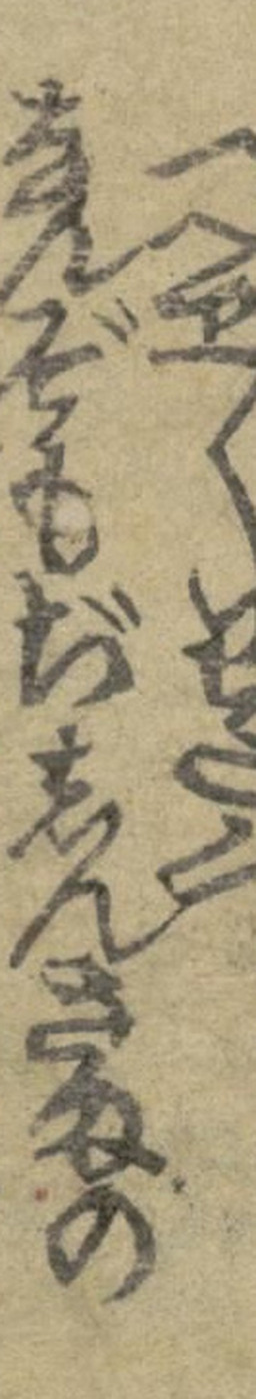なんぞもぢしんさまの
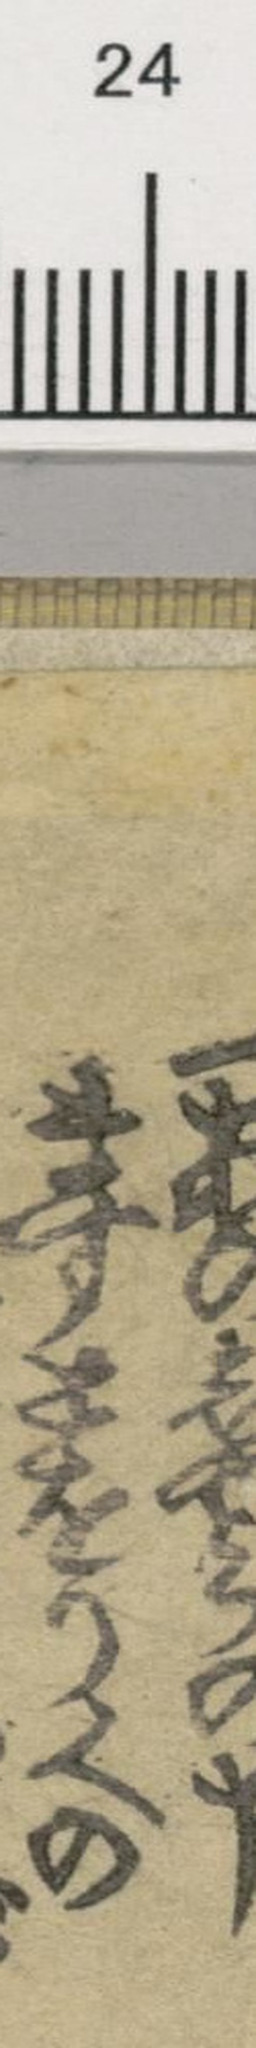ますとをり人の
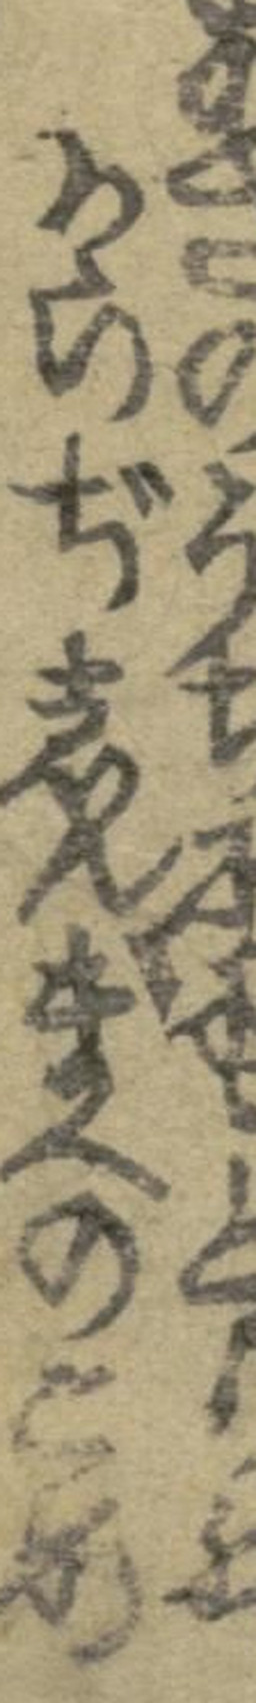からぢしんまへのこめ
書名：生捕ました三度の大地震
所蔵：東京大学地震研究所図書室 Earthquake Research Institute Library, The University of Tokyo, JAPAN
